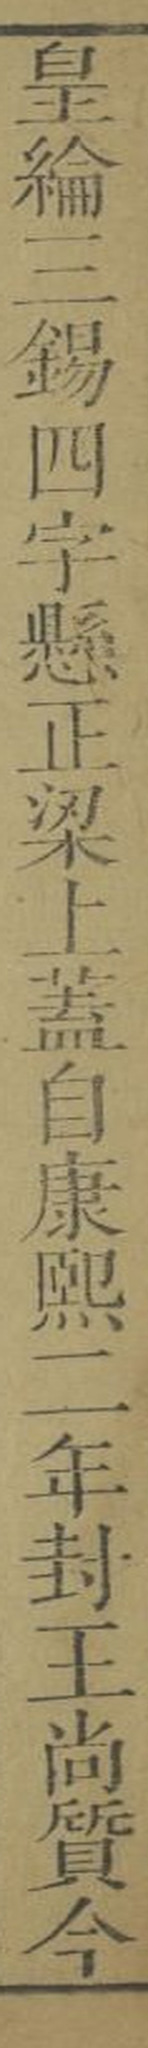皇綸三錫四字懸正梁上蓋自康煕二年封王尚質今
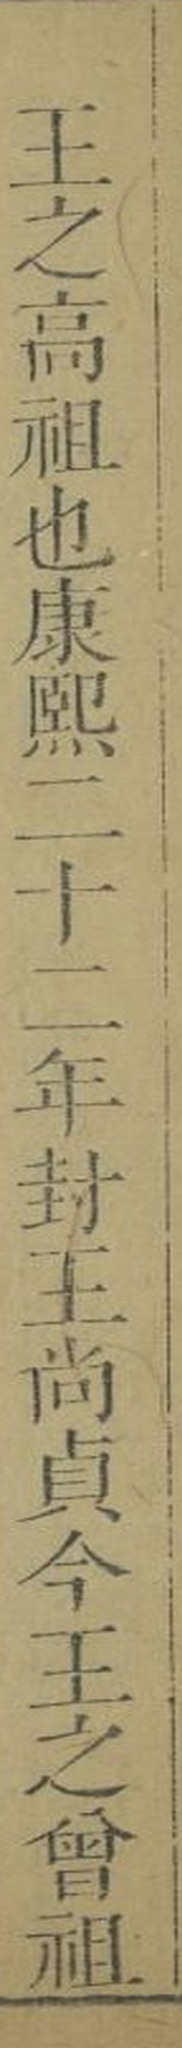王之高祖也康煕二十二年封王尚貞今王之曾祖
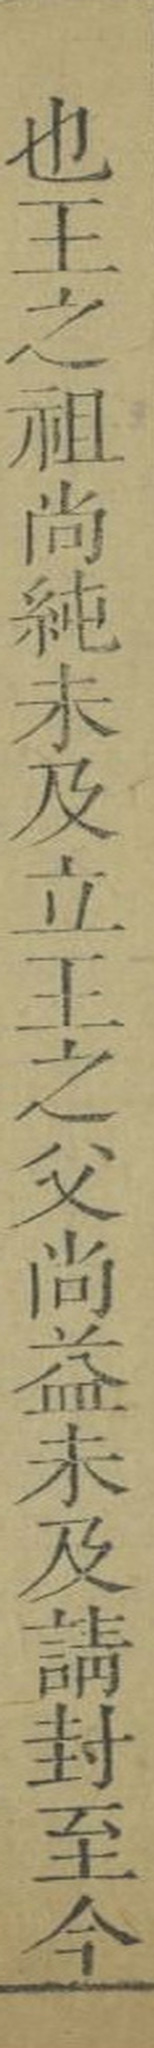也王之祖尚純未及立王之父尚益未及請封至今
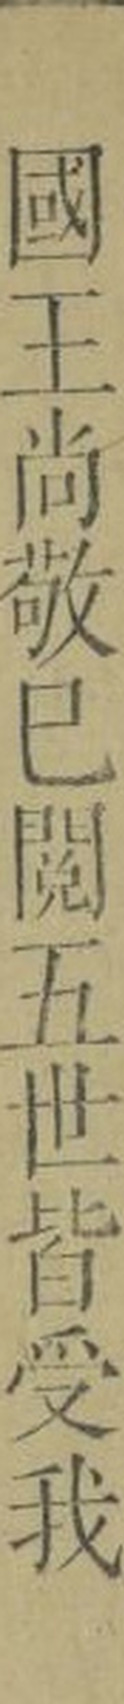國王尚敬巳閲五世皆受我
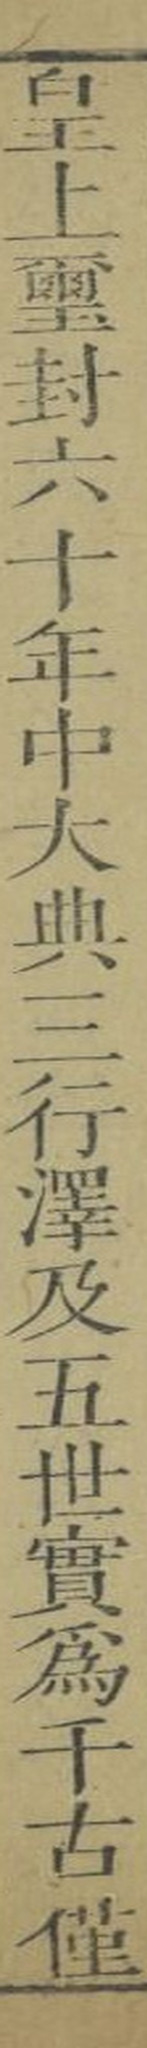皇上璽封六十年中大典三行澤及五世實爲千古僅
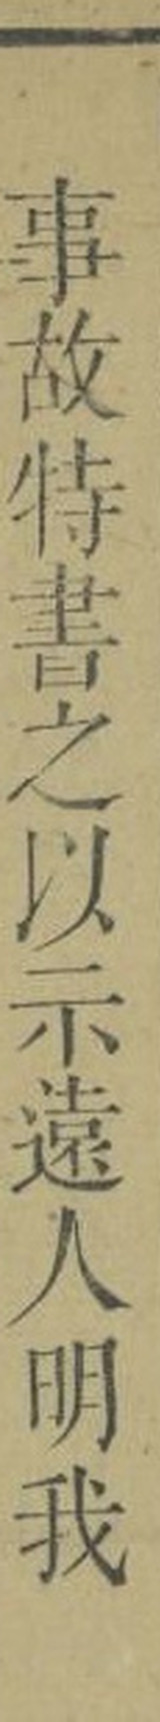事故特書之以示遠人明我
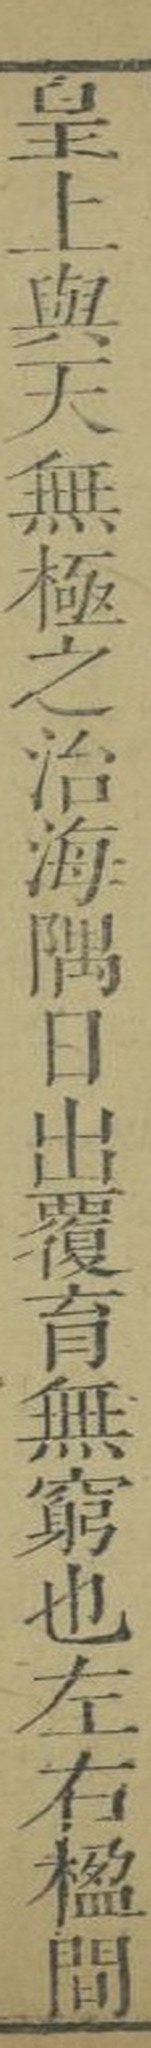皇上與天無極之治海隅日出覆育無窮也左右楹間
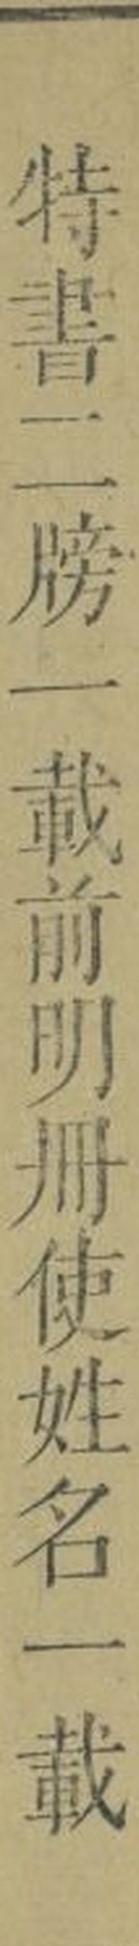特書二牓一載前明冊使姓名一載
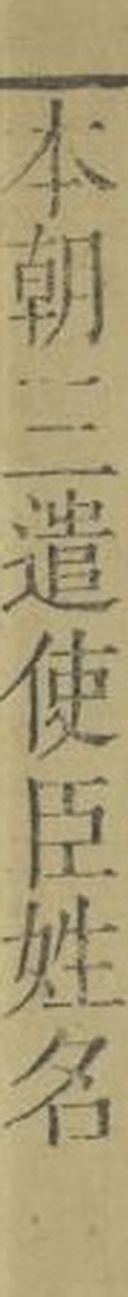本朝三遣使臣姓名
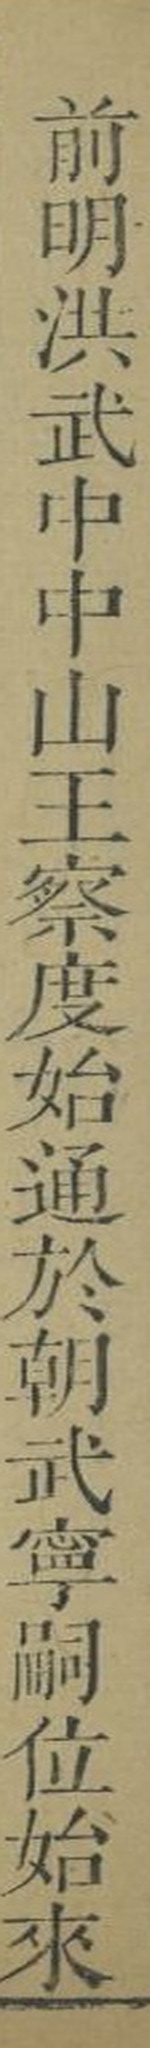前明洪武中中山王察度始通於朝武寧嗣位始來
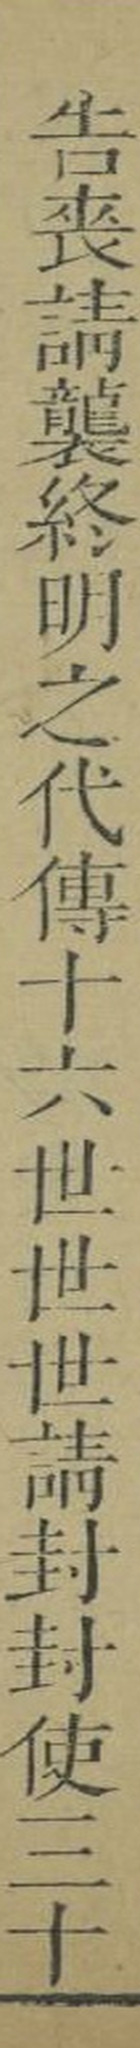告䘮請襲終明之代傳十六世世世請封封使三十
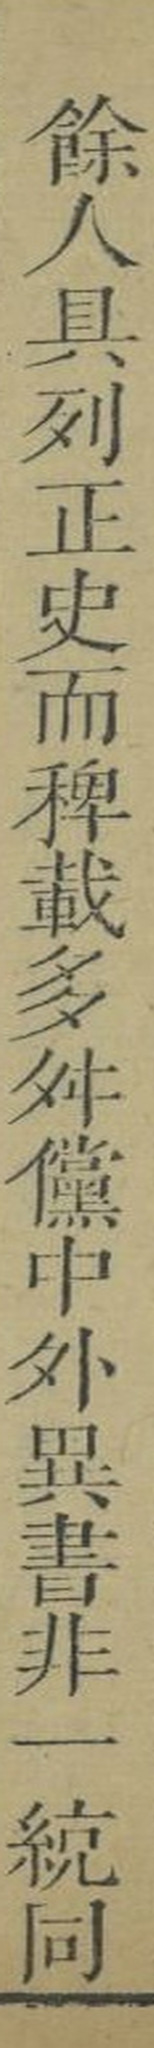餘人具列正史而稗載多舛儻中外異書非一綂同
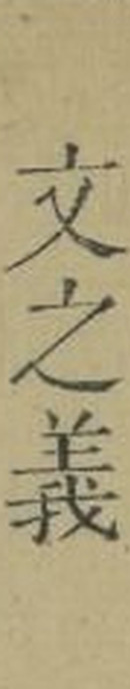文之義
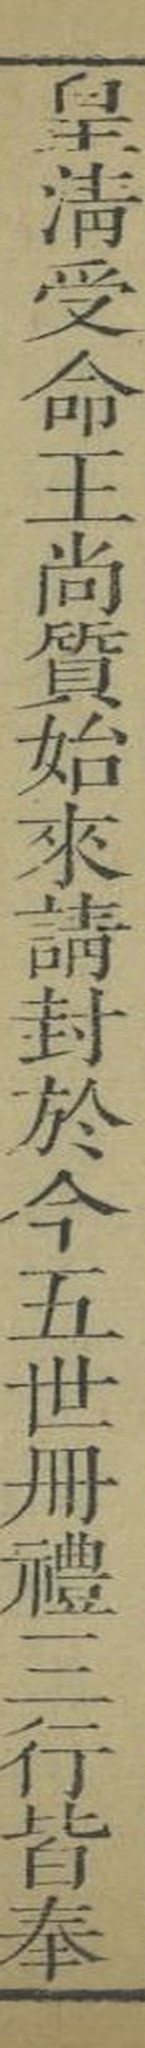皇淸受命王尚質始來請封於今五世冊禮三行皆奉
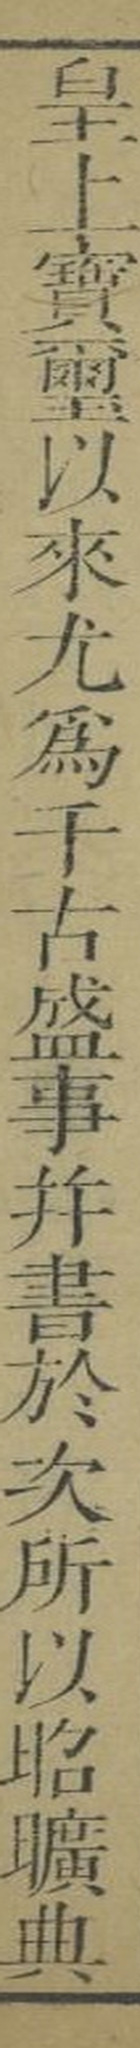皇上寶璽以來尤爲千古盛事幷書於次所以眧矌典
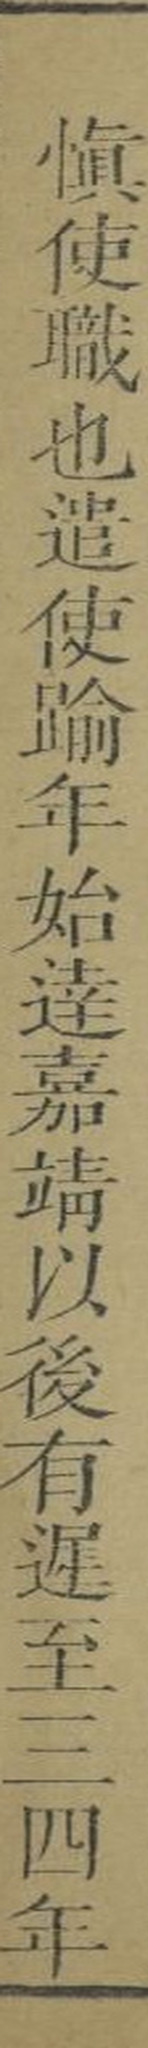愼使職也遣使踰年始逹嘉靖以後有遲至三四年
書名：中山伝信録 巻二
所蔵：University of the Ryukyus Library
